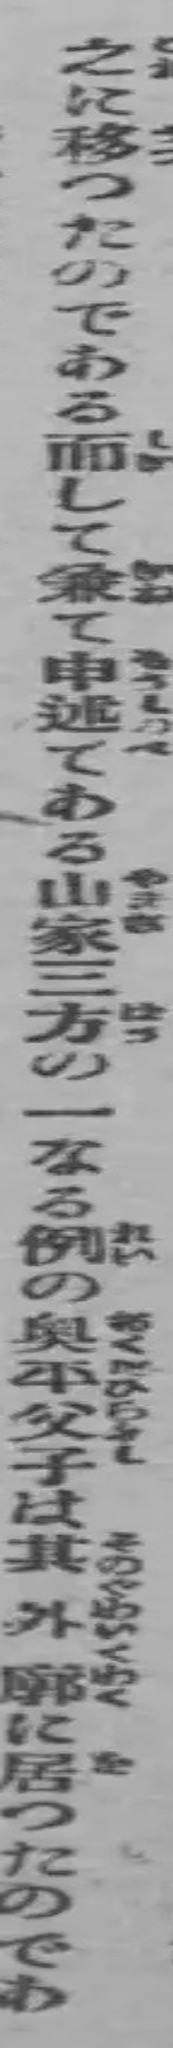之に移つたのである而して兼て申述てある山家三方の一なる例の奥平父子は其外廓に居つたのであ
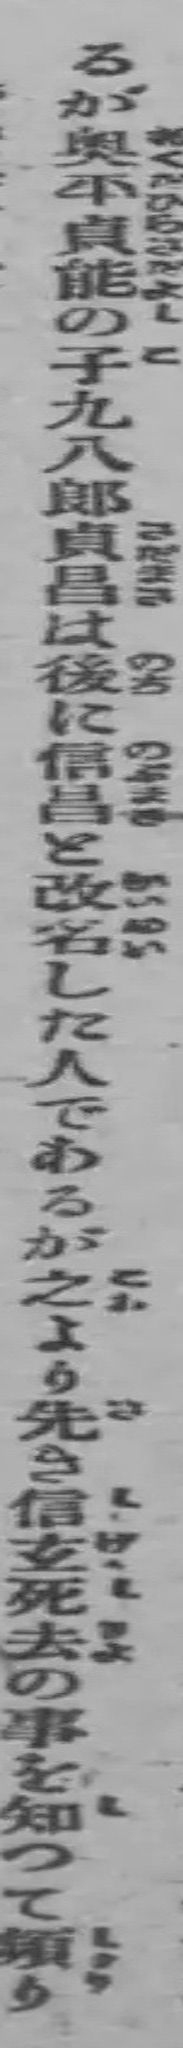るが奥平貞能の子九八郎貞昌は後に信昌と改名した人であるが之より先き信玄死去の事を知つて頻り
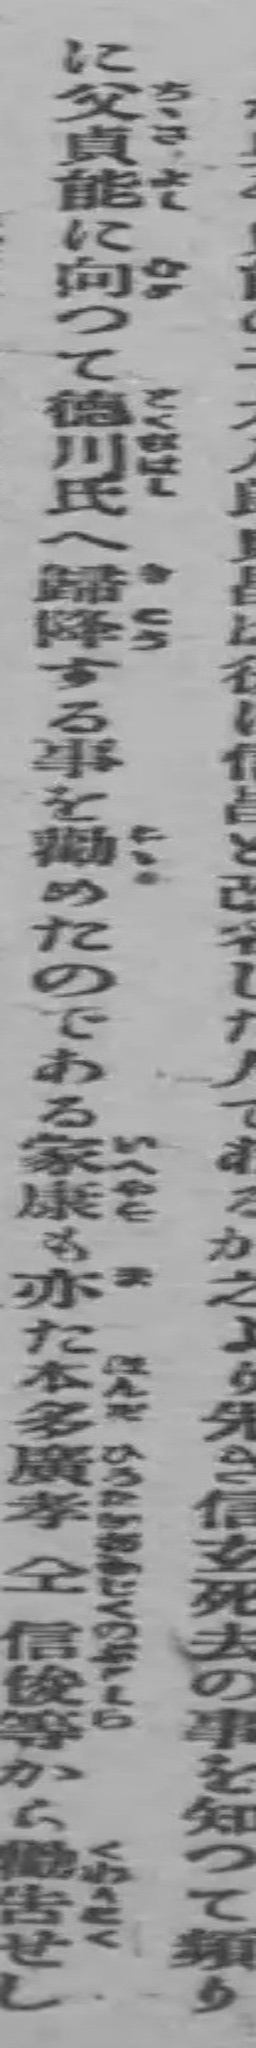に父貞能に向つて徳川氏へ帰降する事を勧めたのである家康も亦た本多広孝仝信俊等から勧告せし
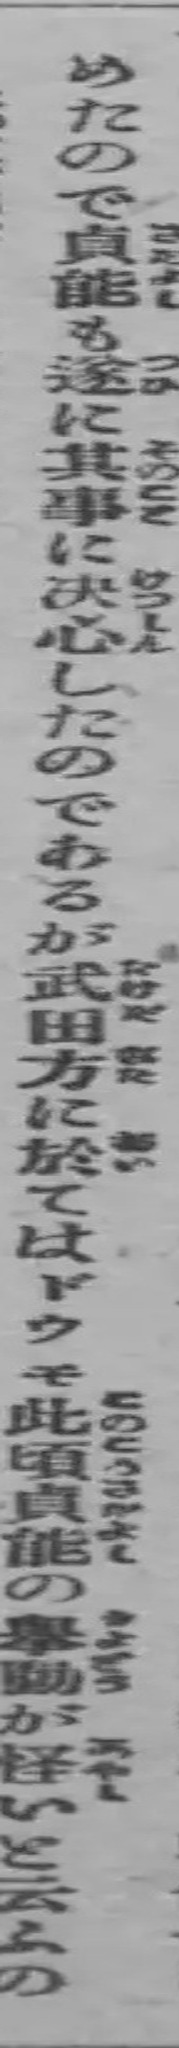めたので貞能も遂に其事に決心したのであるが武田方に於てはドウモ此頃貞能の挙動が怪いと云ふの
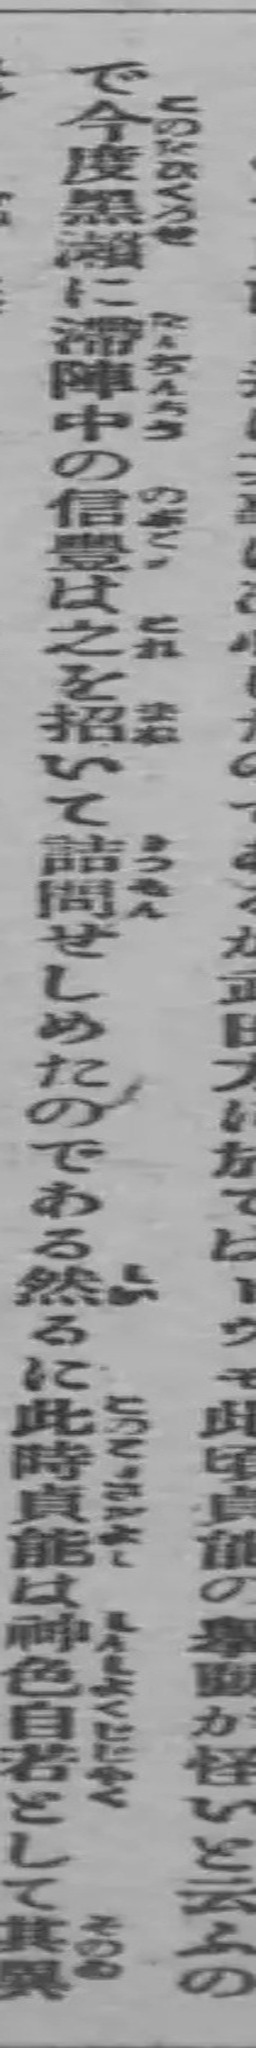で今度黒瀬に滞陣中の信豊は之を招いて詰問せしめたのである然るに此時貞能は神色自若として其異
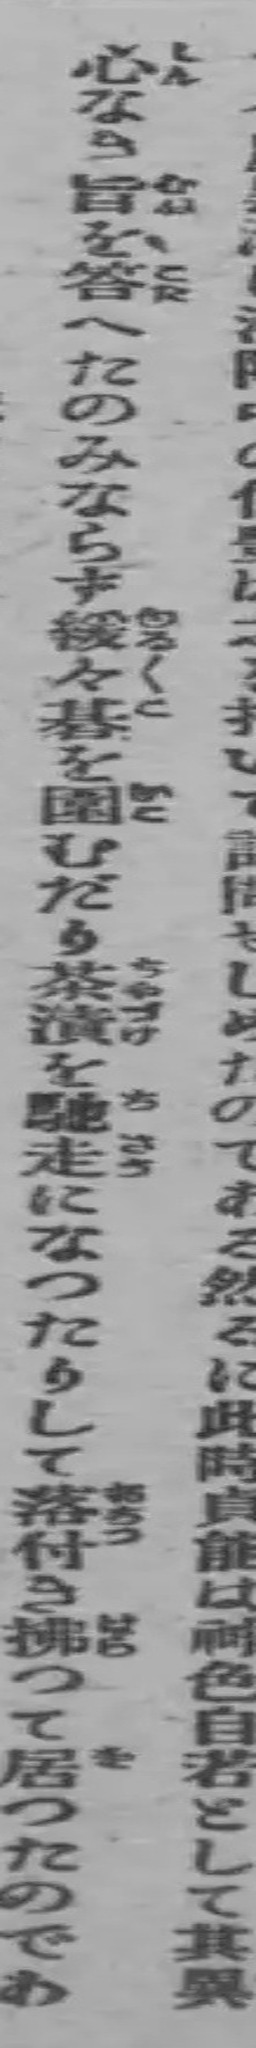心なき旨を答へたのみならず緩々碁を囲むだり茶漬を馳走になつたりして落付き払つて居つたのであ
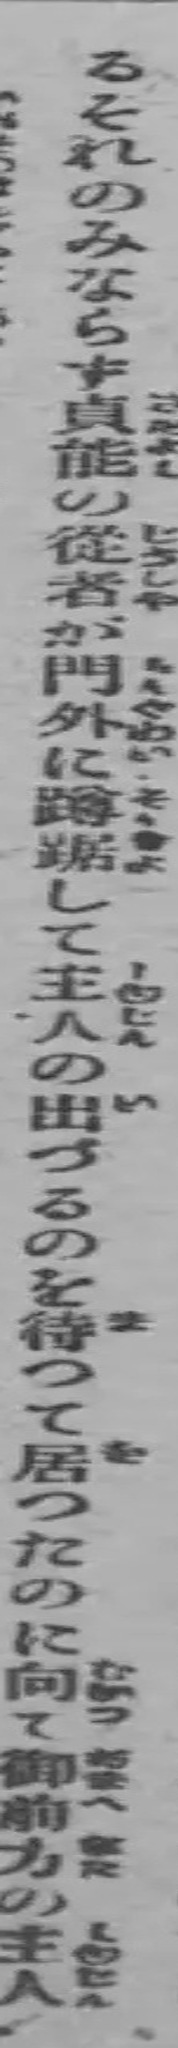るそれのみならず貞能の従者が門外に蹲踞して主人の出づるのを待つて居つたのに向て御前方の主人
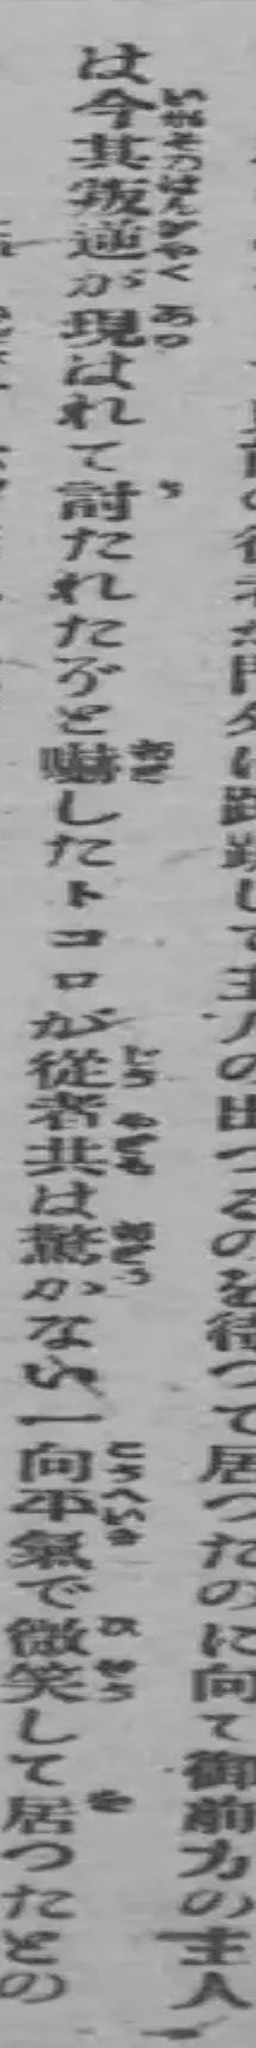は今其叛逆が現はれて討たれたぞと嚇したトコロが従者共は驚かない一向平気で微笑して居つたとの
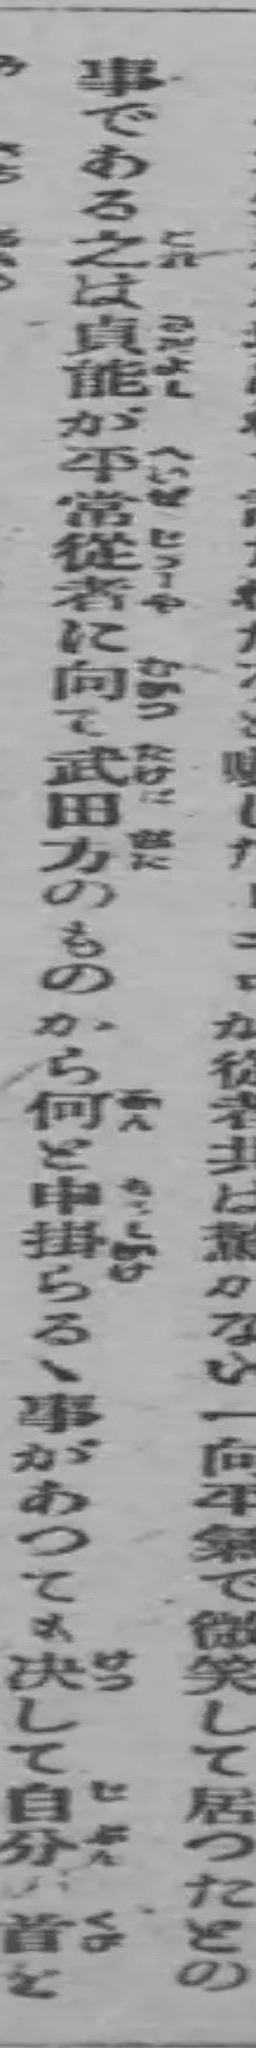事である之は貞能が平常従者に向て武田方のものから何と申掛らるゝ事があつても決して自分の首を
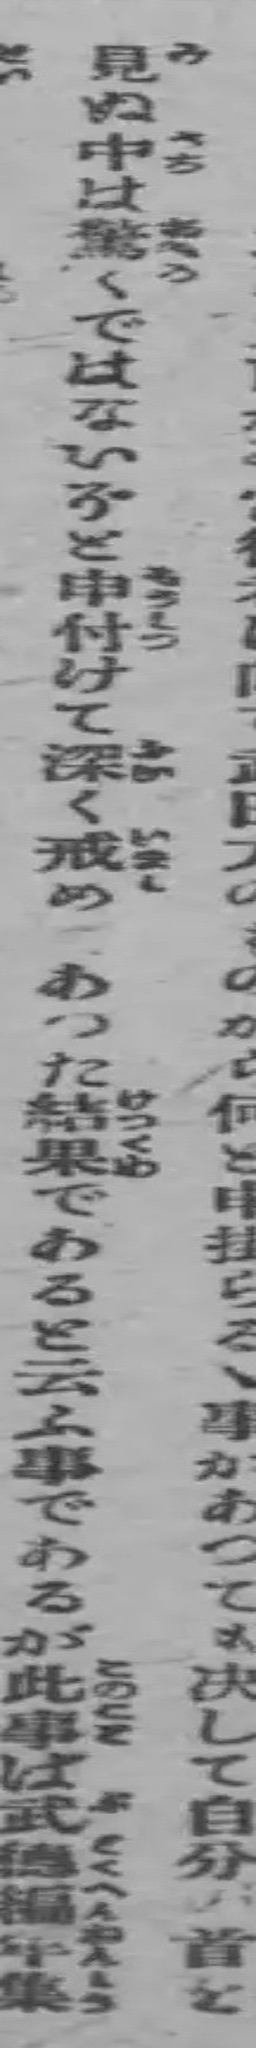見ぬ中は驚くではないぞと申付けて深く戒めてあつた結果であると云ふ事であるが此事は武徳編年集
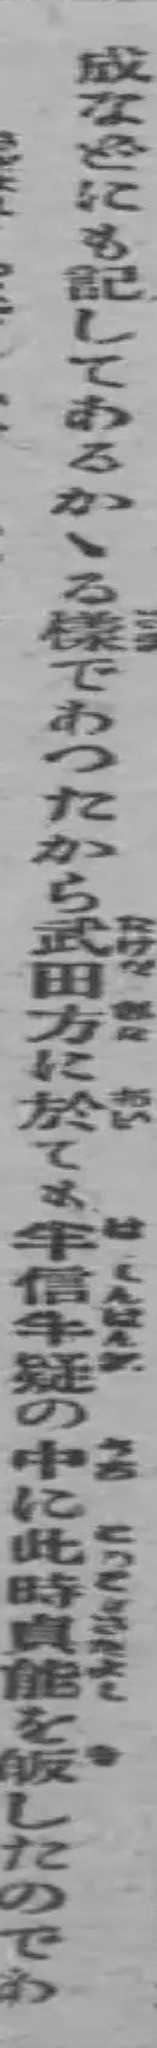成などにも記してあるかゝる様であつたから武田方に於ても半信半疑の中に此時貞能を皈したのであ
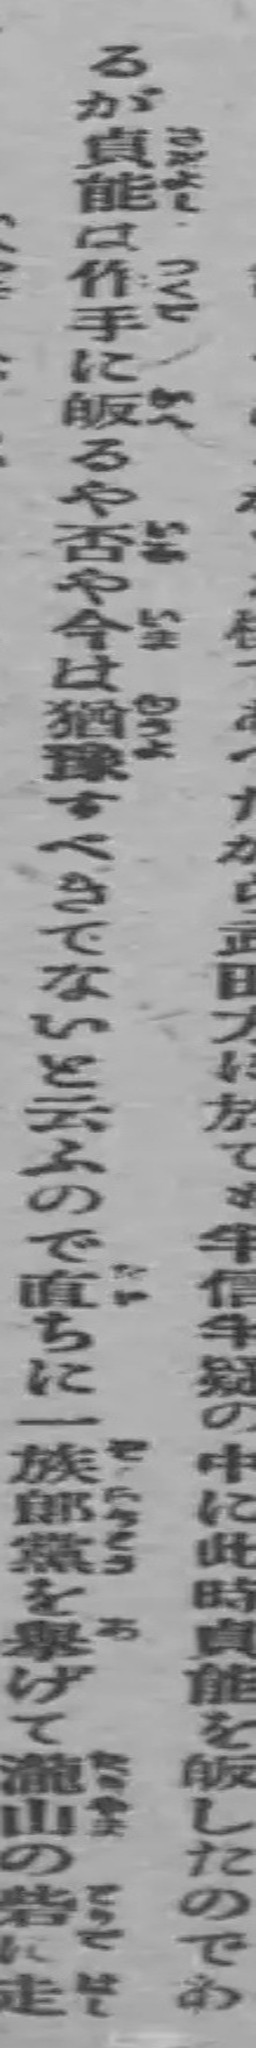るが貞能は作手に皈るや否や今は猶予すべきではないと云ふので直ちに一族郎党を挙げて瀧山の砦に走
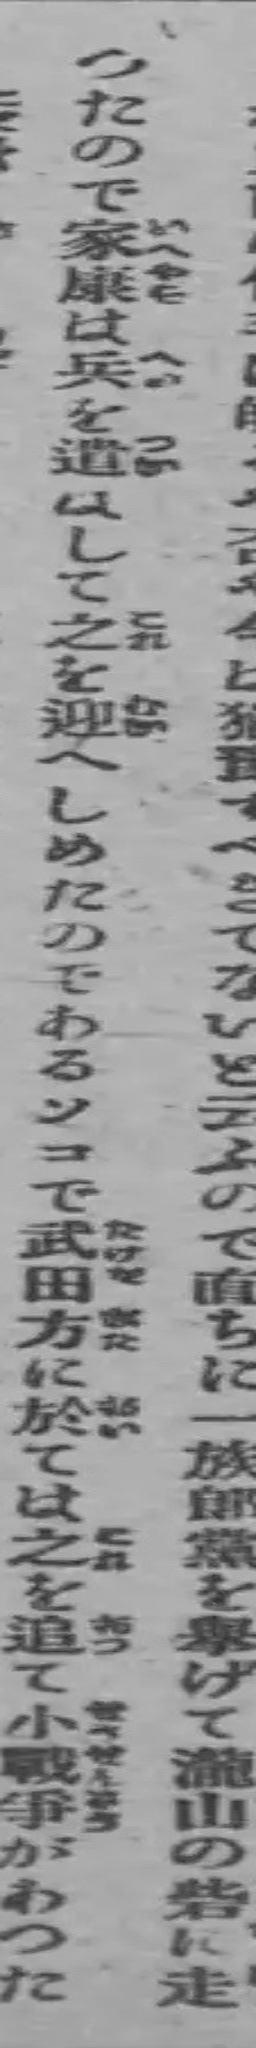つたので家康は兵を遣はして之を迎へしめたのであるソコで武田方に於ては之を追て小戦争があつた
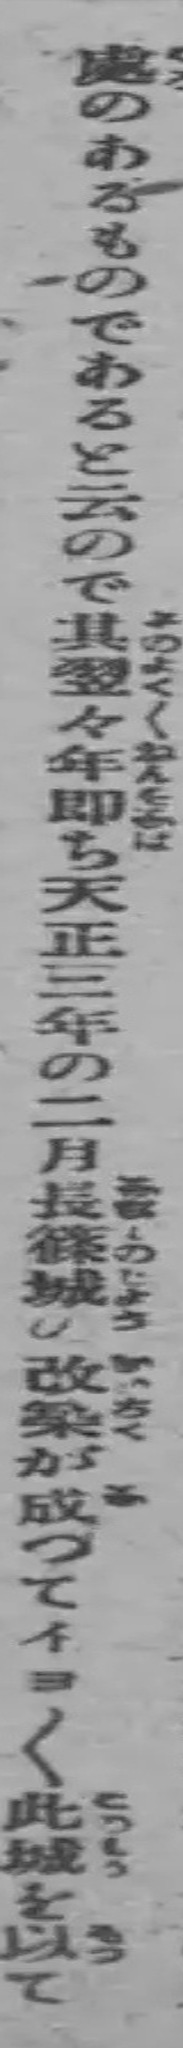む処のあるものであると云ので其翌々年即ち天正三年の二月長篠城の改築が成つてイヨ〳〵此城を以て
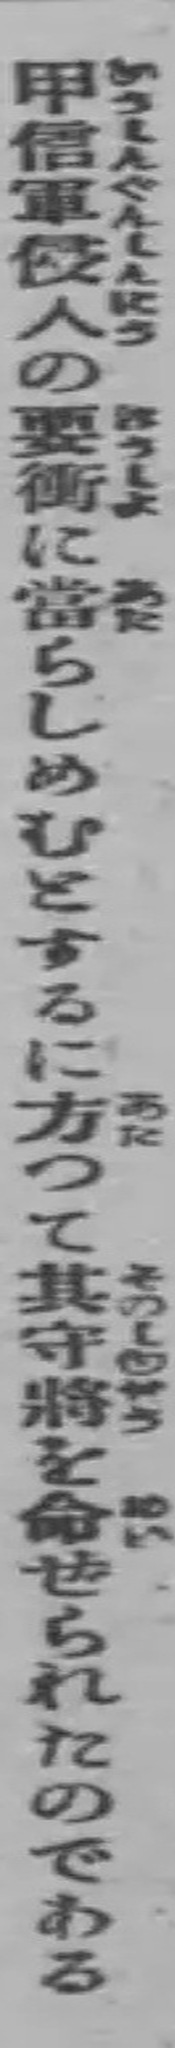甲信軍侵入の要衝に当らしめむとするに方つて其守将を命ぜられたのである
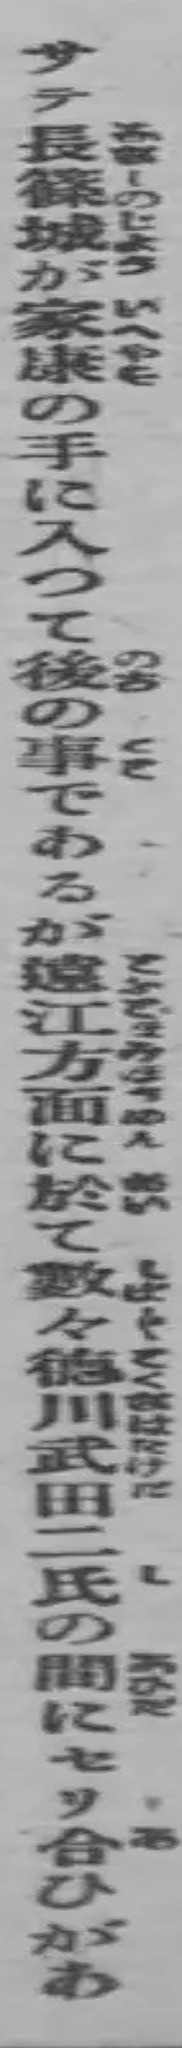サテ長篠城が家康の手に入つて後の事であるが遠江方面に於て数々徳川武田二氏の間にセリ合ひがあ
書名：豊橋市史談
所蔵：国立国会図書館 National Diet Library, JAPAN
